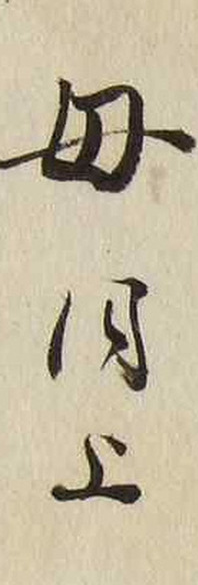母同上

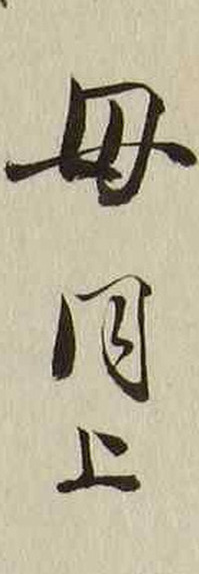母同上
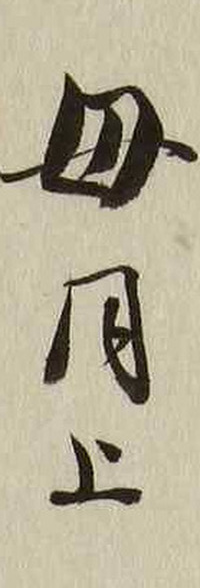母同上
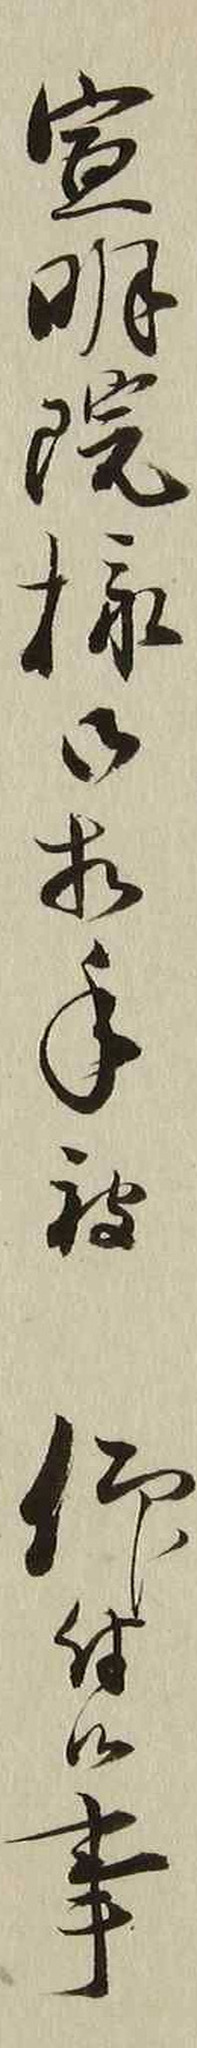宣明院様御相手被仰付候事
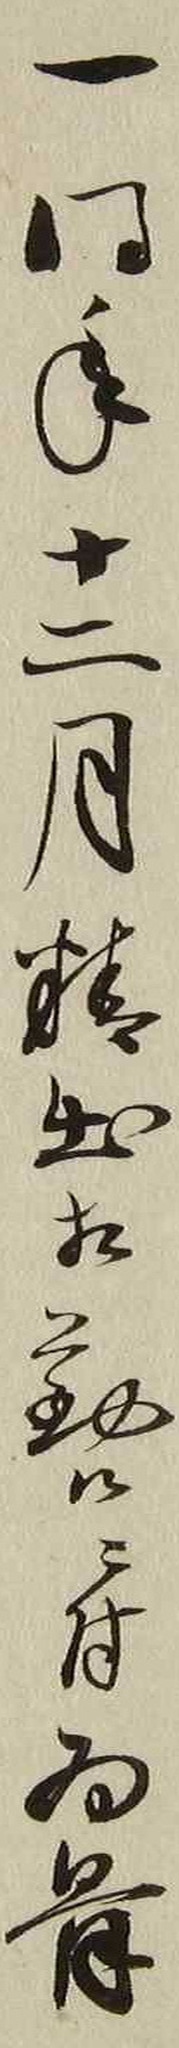一同年十二月精出相勤候に付為骨
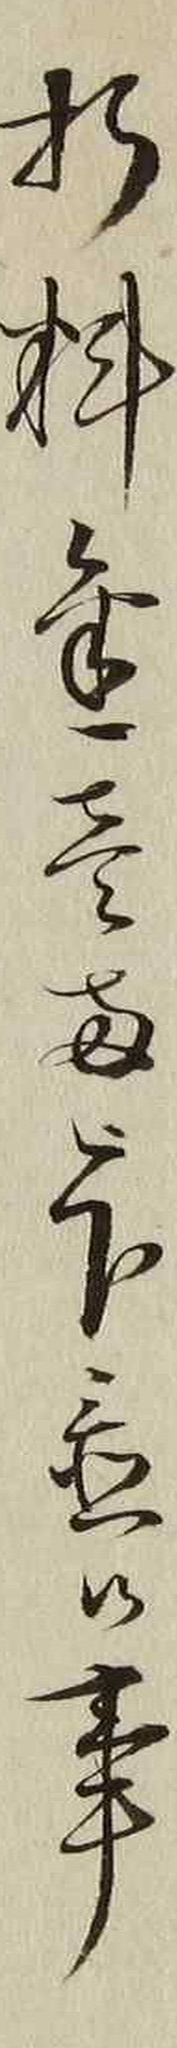折料金壱両被下置候事
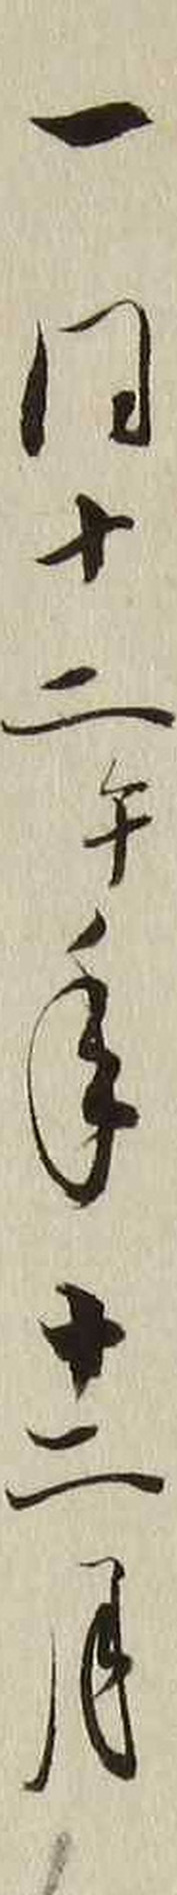一同十二午年十二月
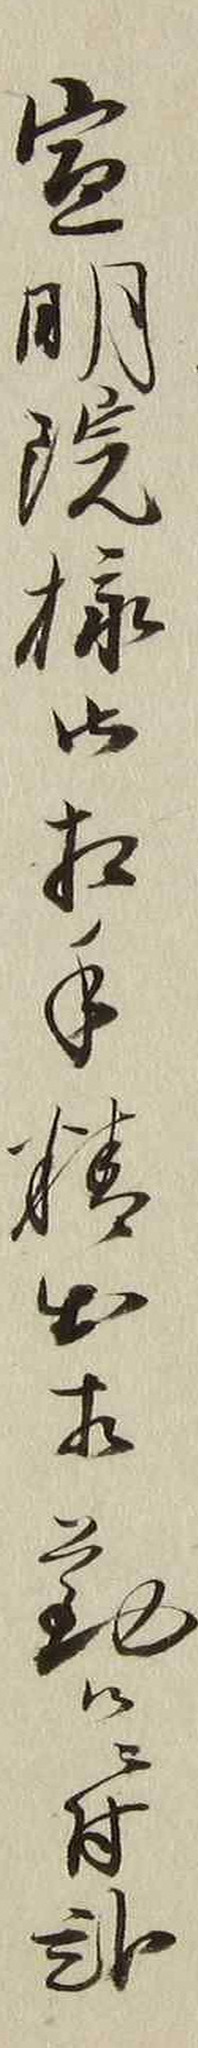宣明院様御相手精出相勤候に付弐
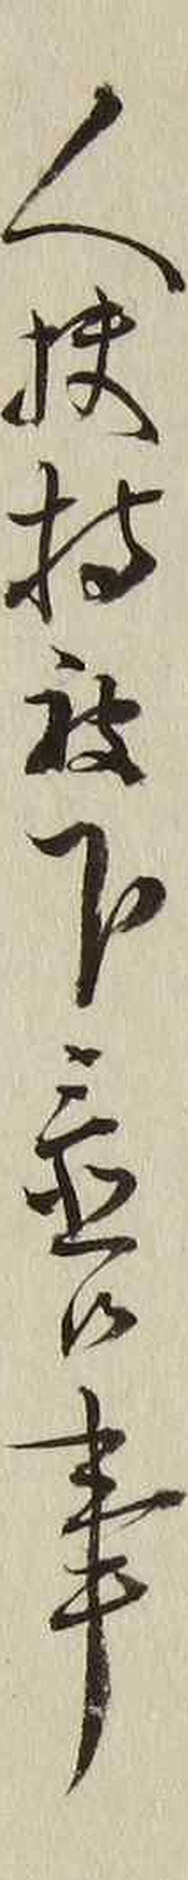人扶持被下置候事
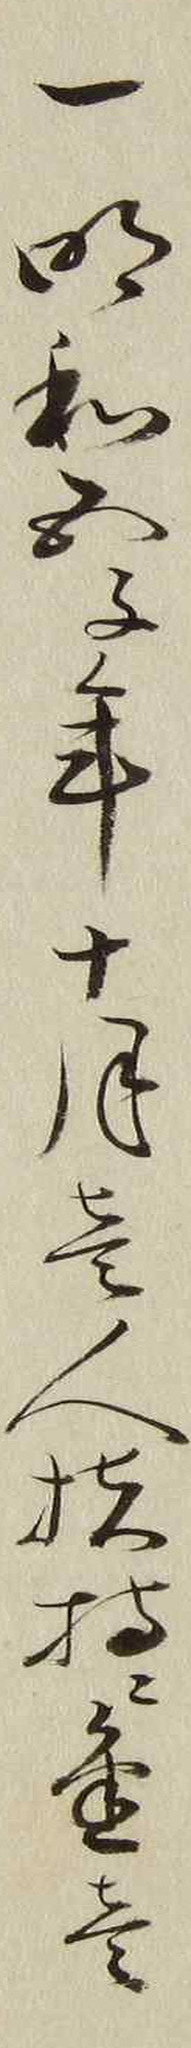一明和五子年十月壱人扶持に金壱
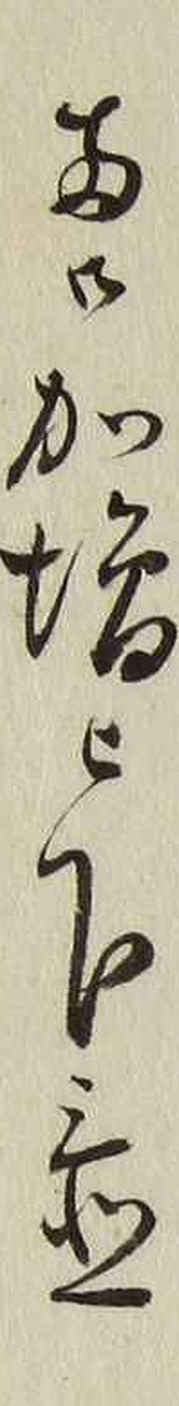両御加増被下置
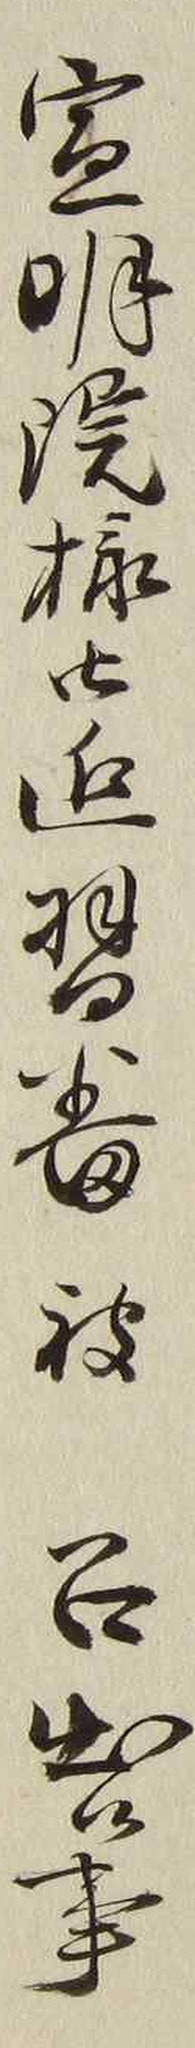宣明院様御近習番被召出候事

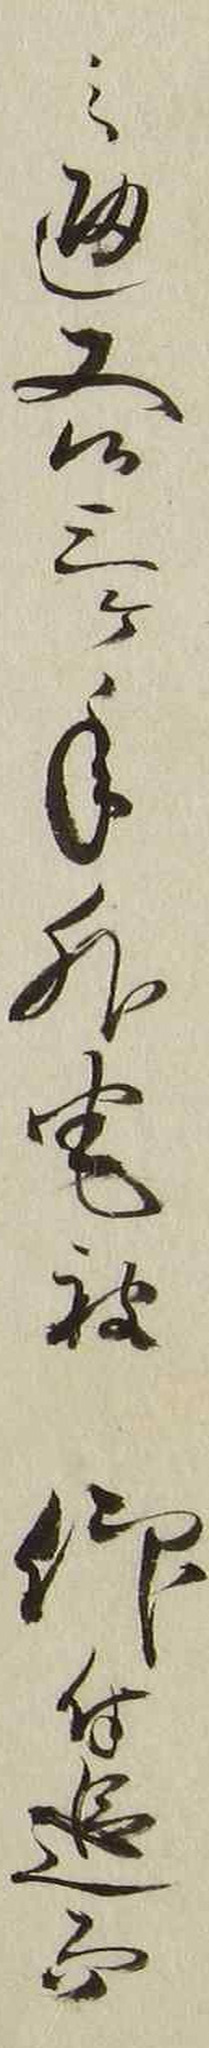之通又御三ヶ年外宅被仰付追而
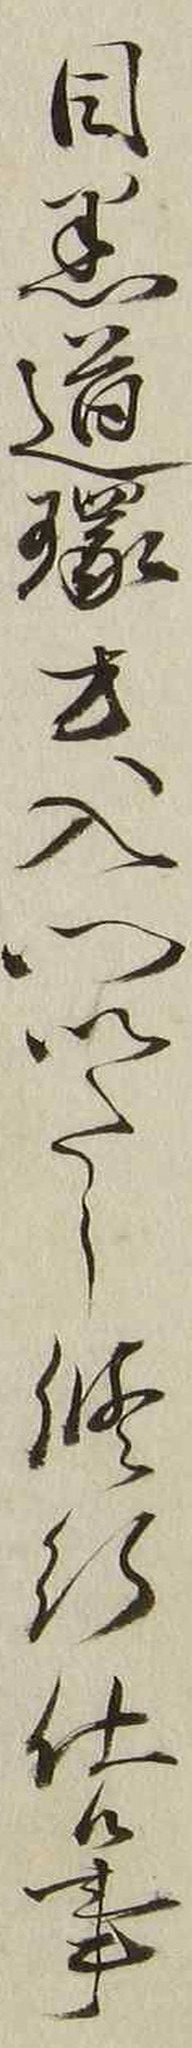目黒道環方へ入門いたし修行仕候事
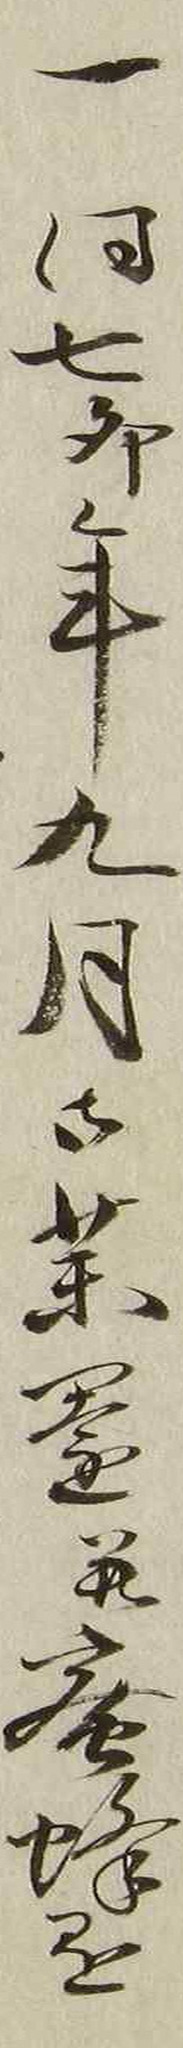一同七卯年九月御薬園并蜜蜂懸
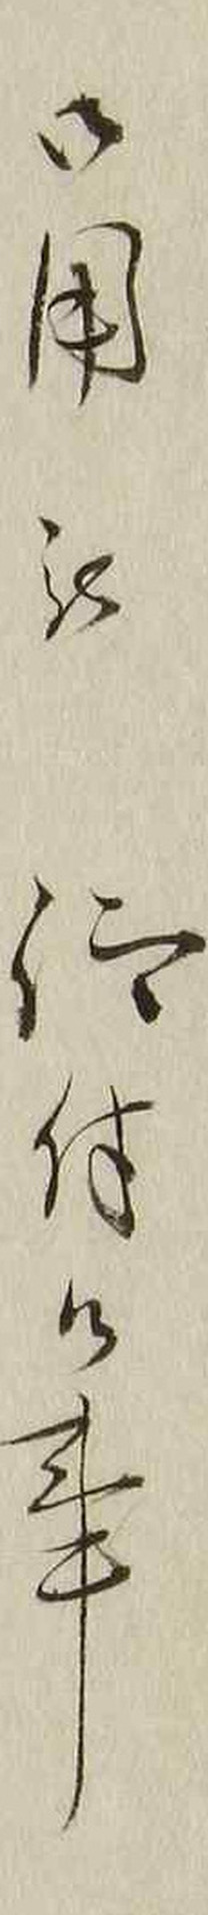御用被仰付候事
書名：諸士系譜　巻之157　ね之部1
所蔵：会津若松市立会津図書館
